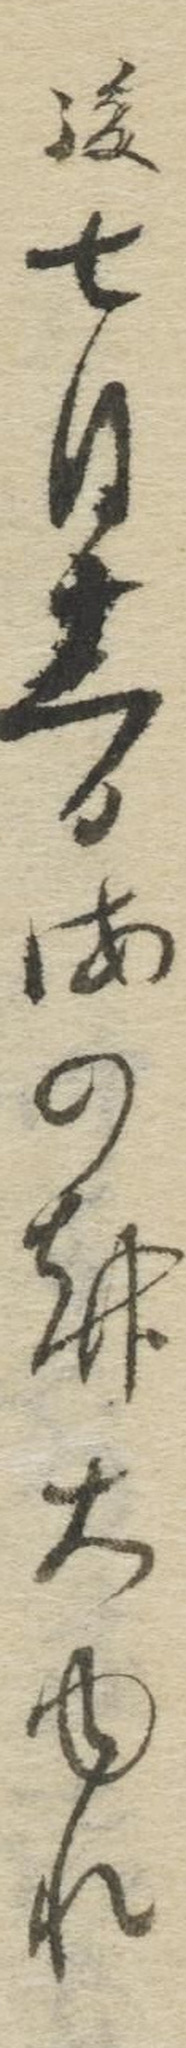後七月十三日戌の刻大ゆれ
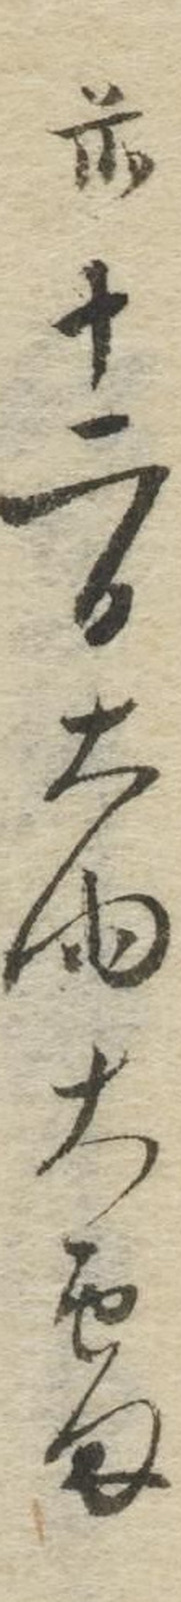前十二日大雨大霽
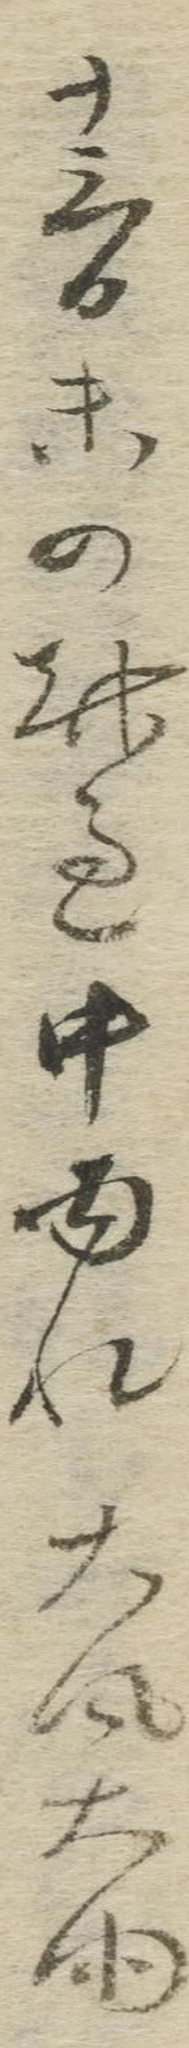十三日未の刻過中ゆれ大風大雨
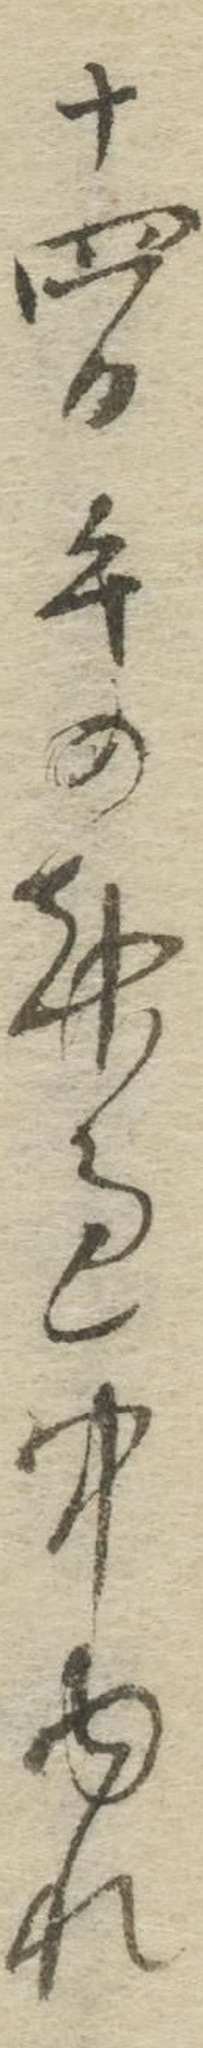十四日午の刻過中ゆれ
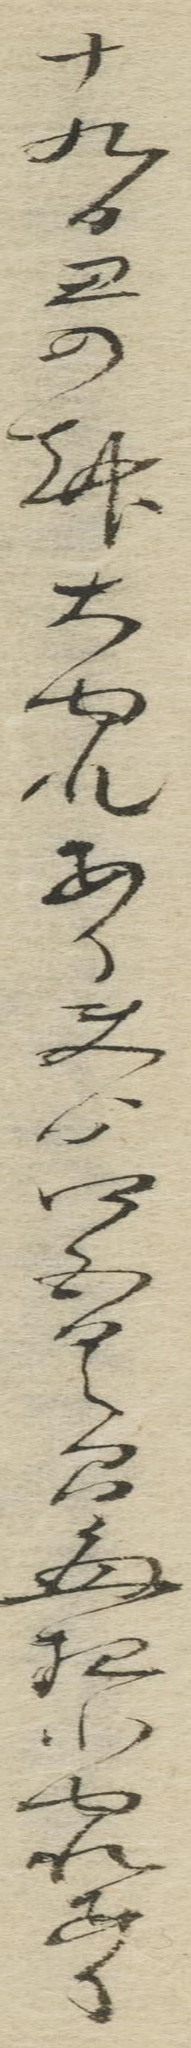十九日丑の刻大ゆれあり夫ゟ四五日之間毎夜小ゆれあり
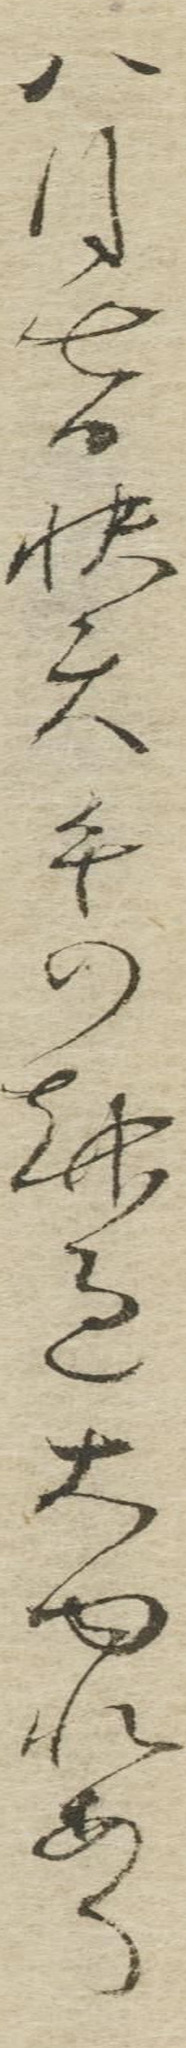八月七日快天午の刻過大ゆれあり

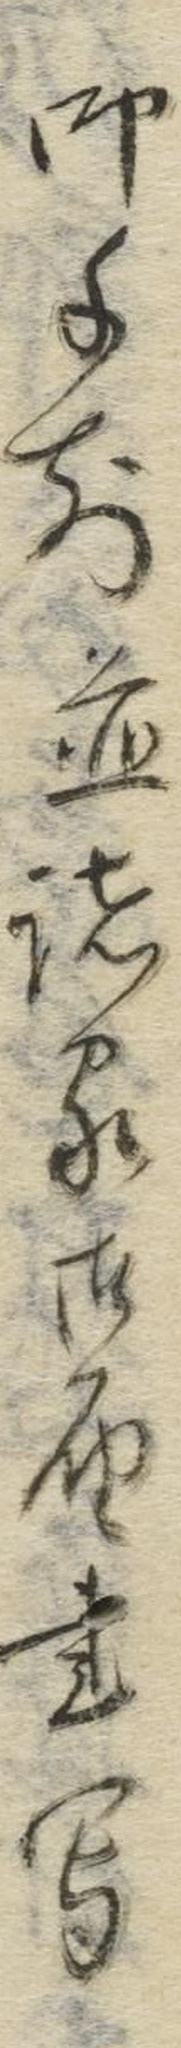御手前並諸家御届書写
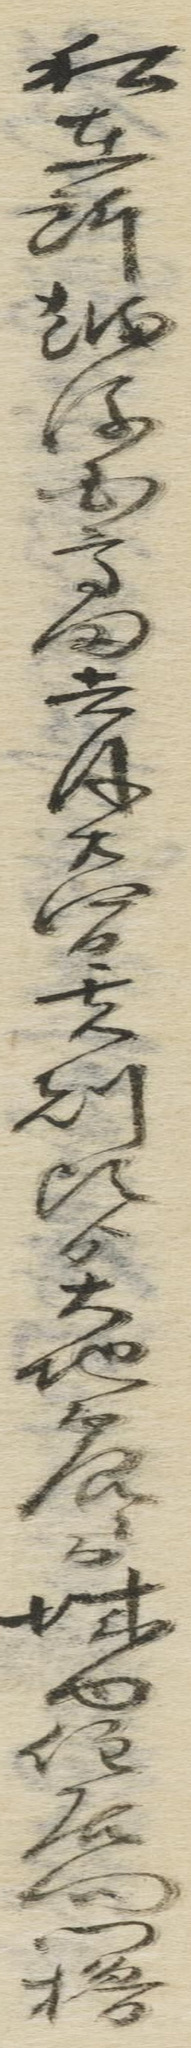私在所越後国高田去月廿四日夜亥刻頃ゟ大地震二而城内住居向門櫓
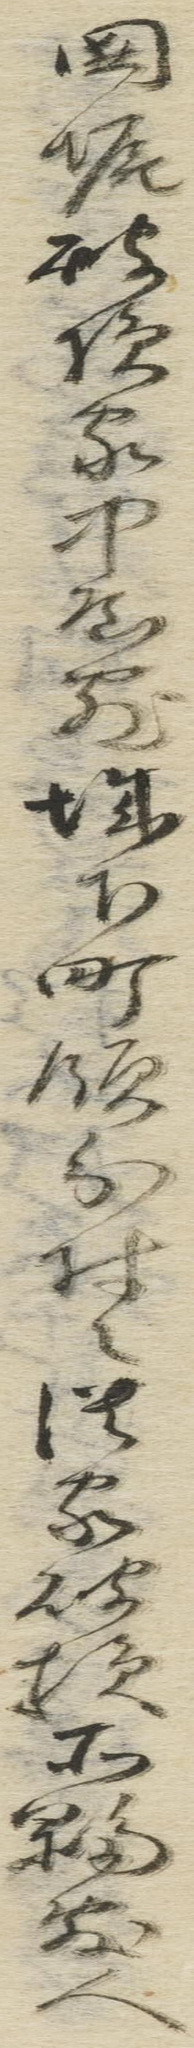囲塀破損家中屋敷城下町領分村々潰家破損所夥敷人
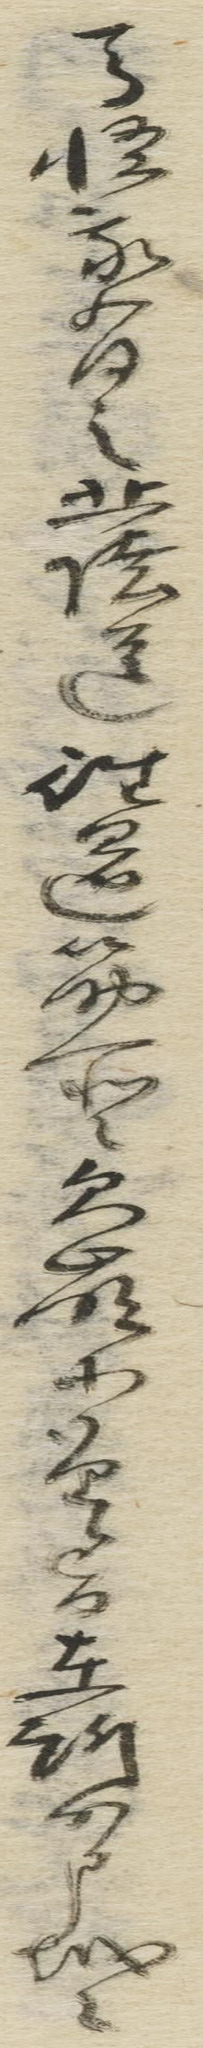馬怪我有之北陸道往還筋所々欠崩に御座候旨在所ゟ申越候
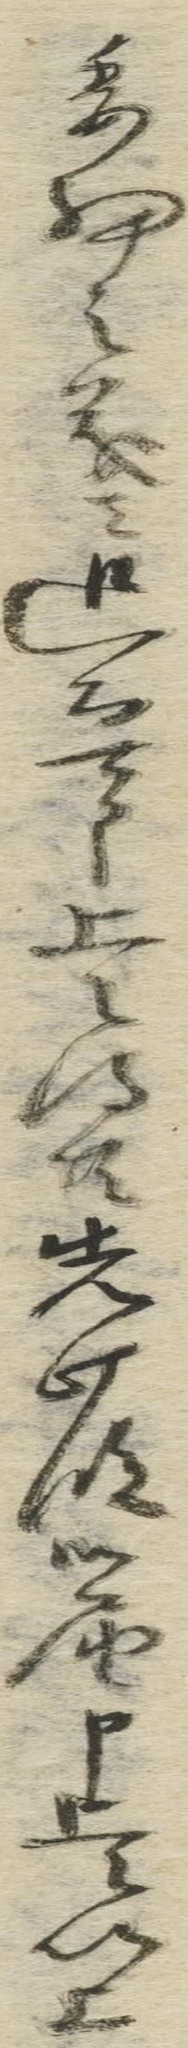委細之義追而可申上候得共先此段御届申上候以上
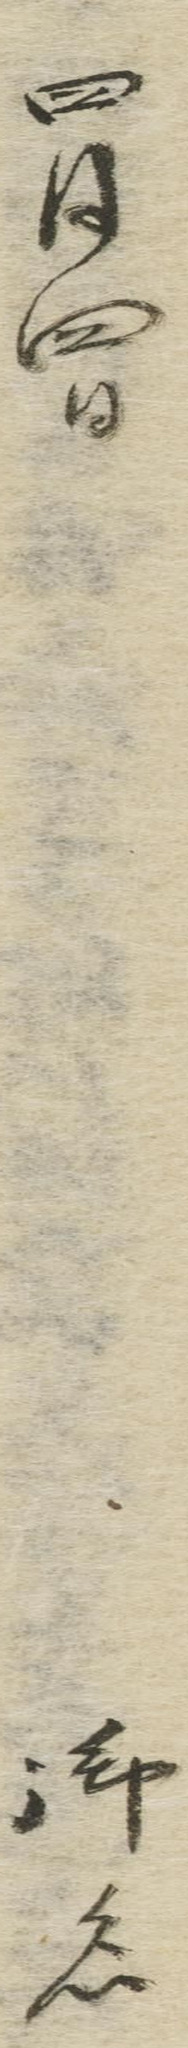四月四日御名
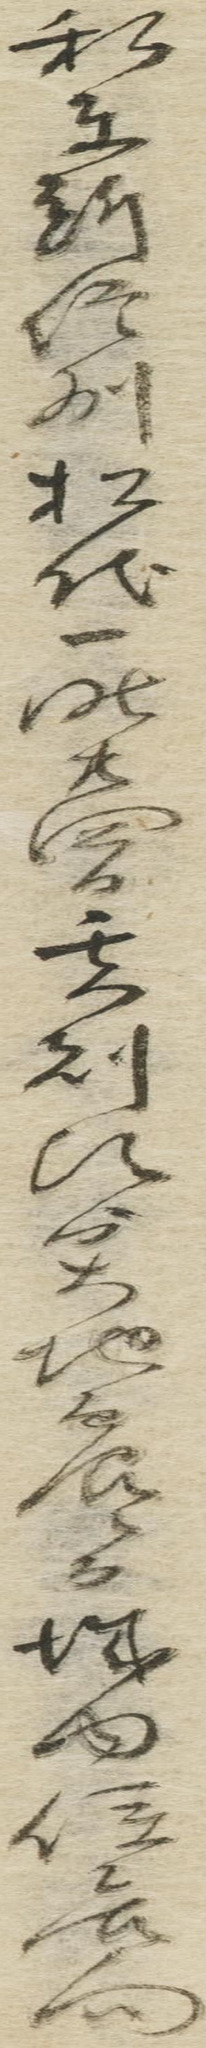私在所信州松代一昨廿四日亥刻頃ゟ大地震二而城内住居向
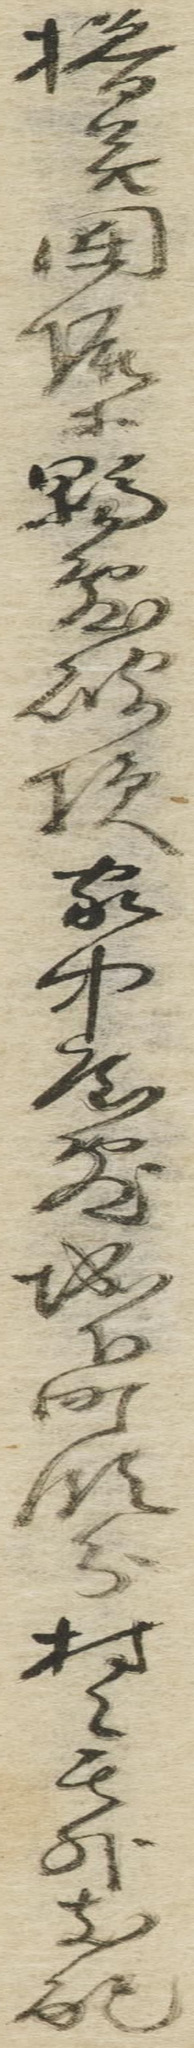櫓并囲塀等夥敷破損家中屋敷城下町領分村々其外支配
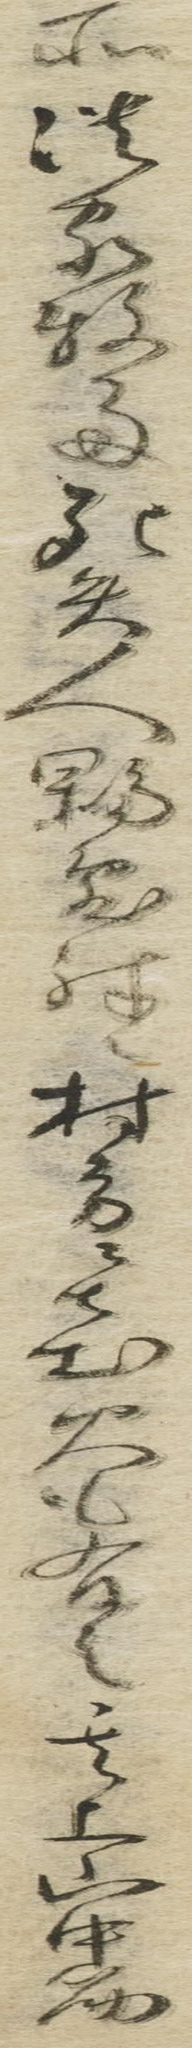所潰家数多死失人夥敷殊二村方二は出火も有之其上山中筋
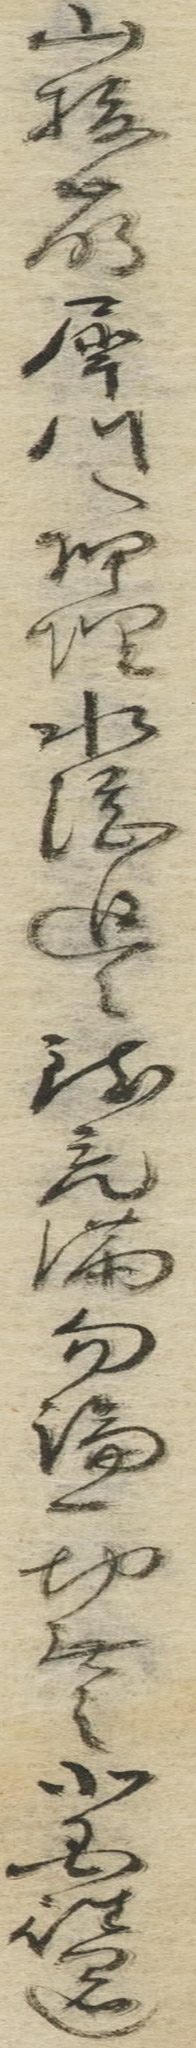山抜崩犀川へ押埋水湛追々致充満勿論一切無之北国往還
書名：弘化丁未天變日記
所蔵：東京大学地震研究所図書室 Earthquake Research Institute Library, The University of Tokyo, JAPAN
